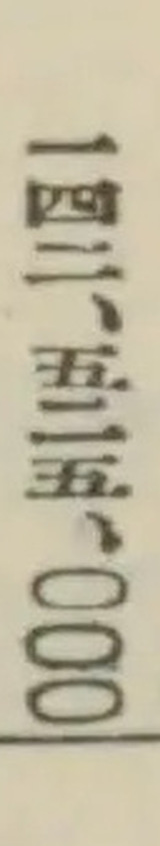計一四二、五二五、〇〇〇
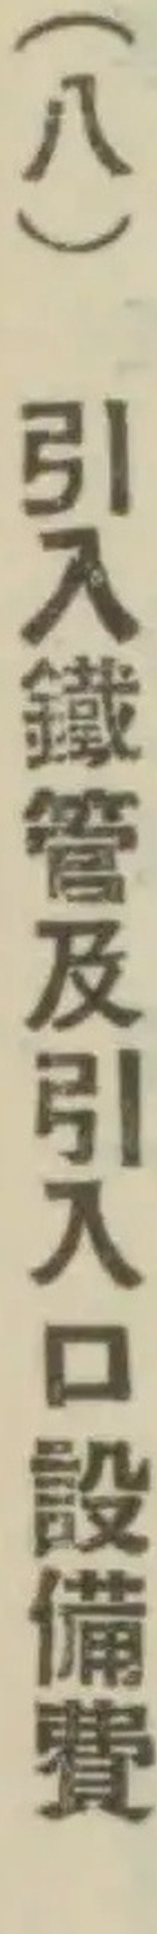(八)引入鐵管及引入口設備費
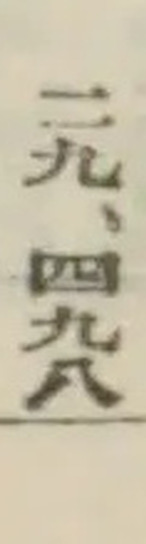計二九、四九八

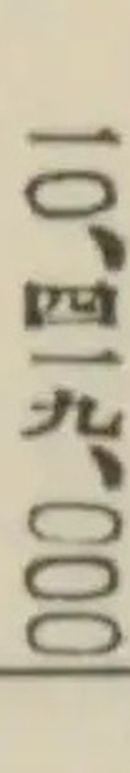計一〇、四一九、〇〇〇
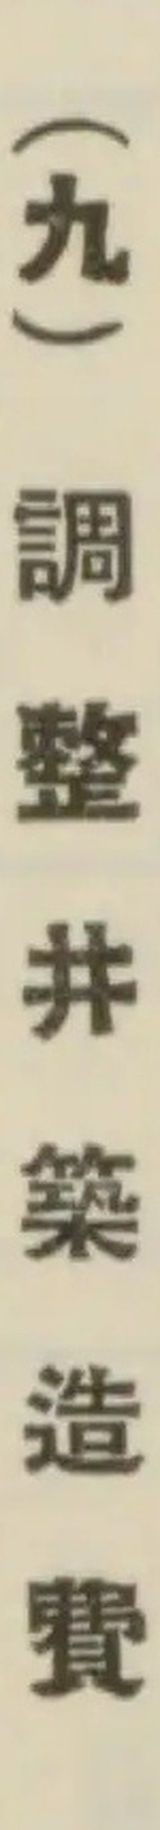(九)調整井築造費

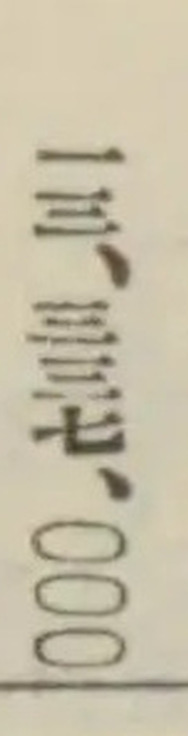計一三、三三七、〇〇〇
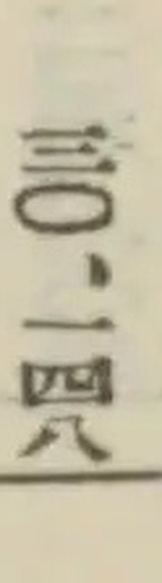計三〇、一四八
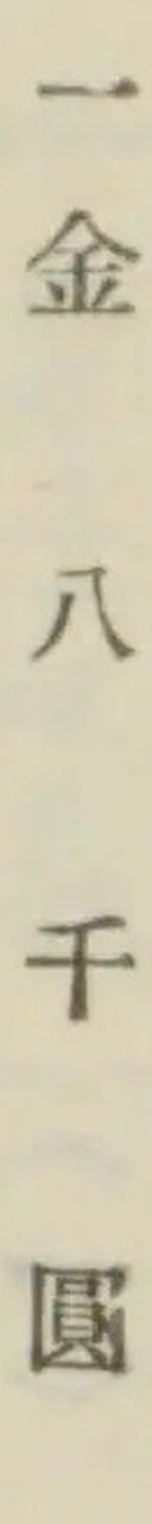一金八千圓
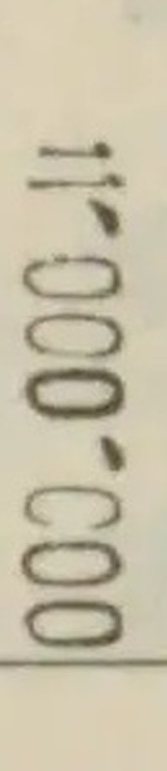計八、〇〇〇、〇〇〇
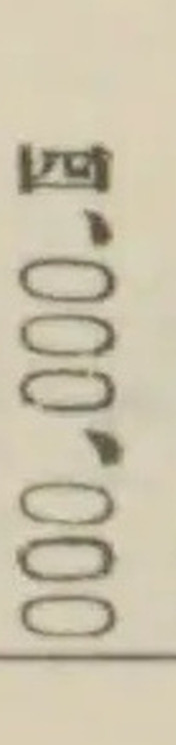計八、〇〇〇、〇〇〇
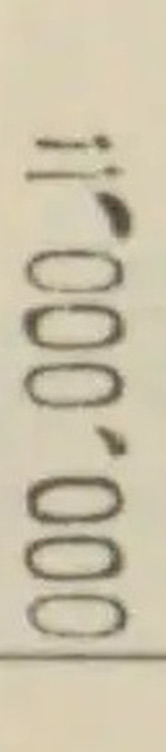計八、〇〇〇、〇〇〇

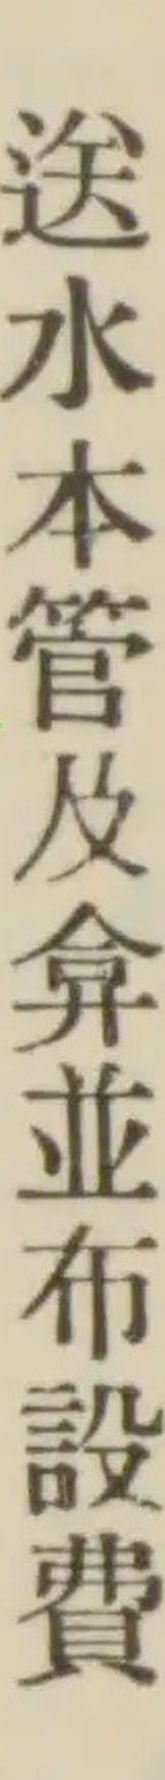送水本管及弇並布設費
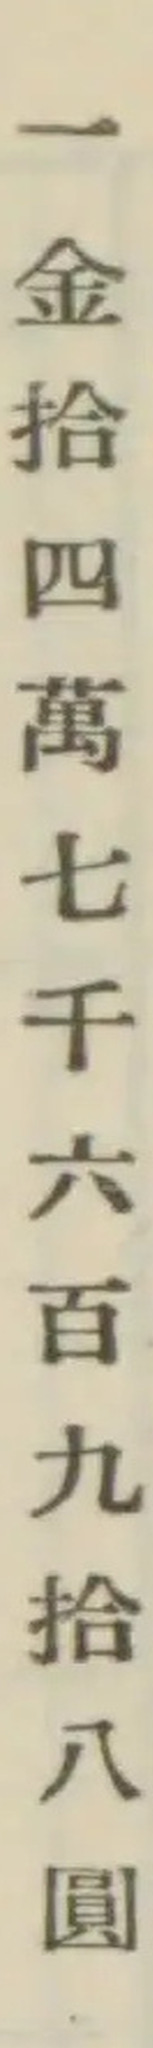一金拾四萬七千六百九拾八圓
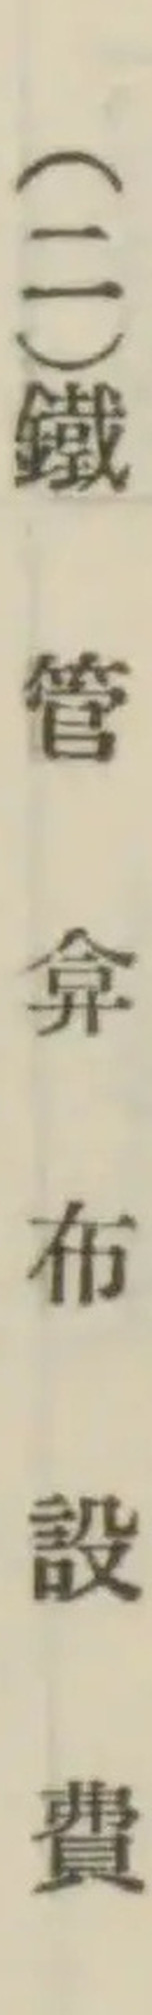(二)鐵管弇布設費
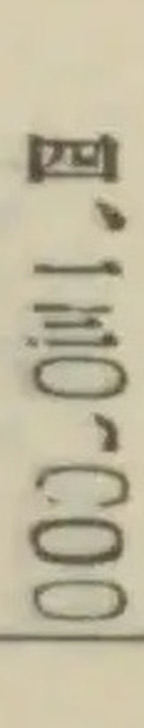計四、一三、〇〇〇〇
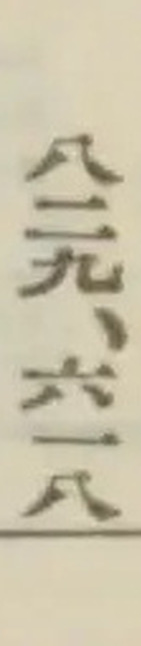計八二九、六一八
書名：豊橋市水道誌
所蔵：国立国会図書館 National Diet Library, JAPAN
